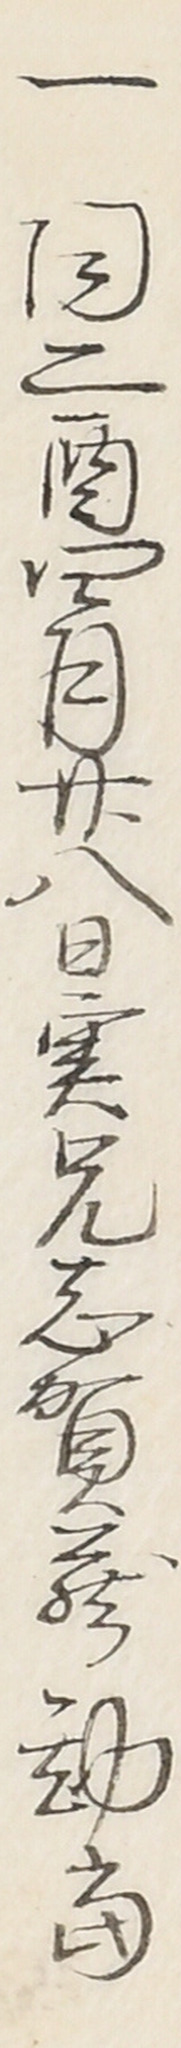一同二酉四月廿八日被実兄志賀蔵勘当
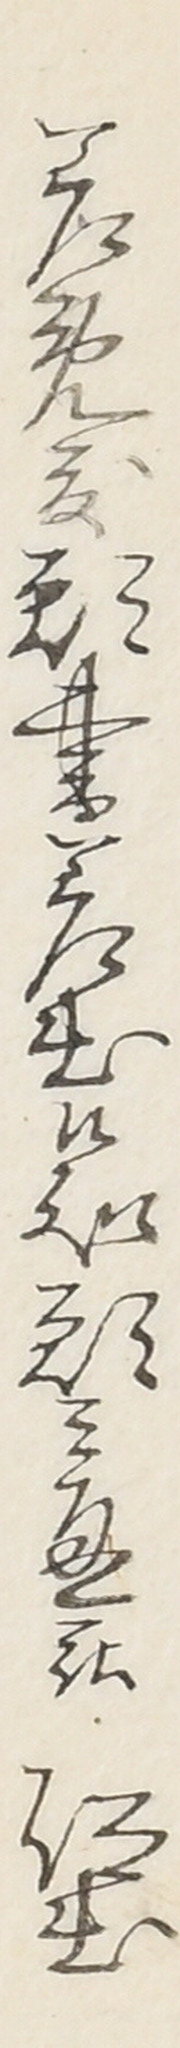差免度願書差出候処願之通被仰出
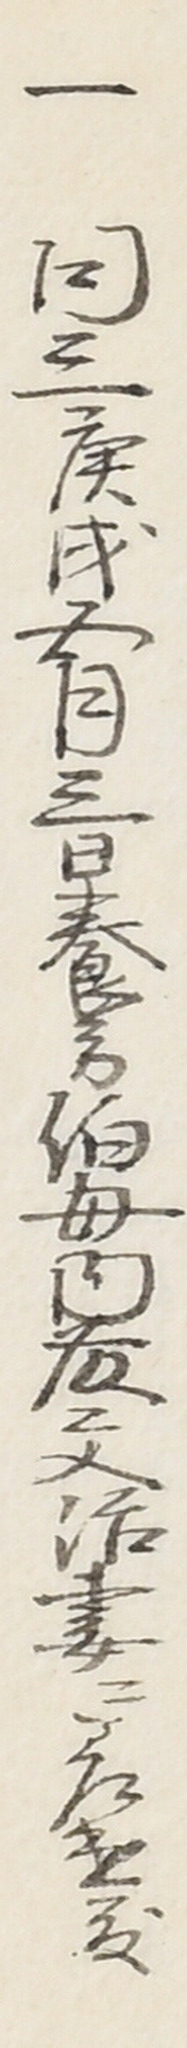一同三庚戌五月三日養方伯母内藤文治妻ニ差遣度
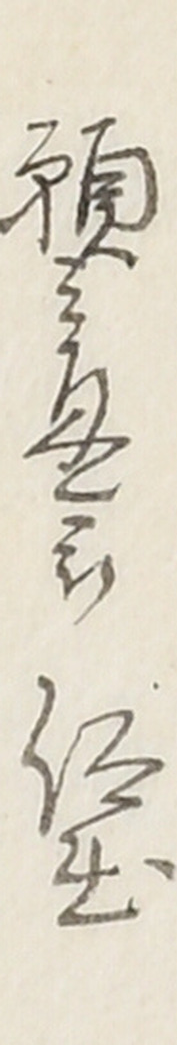願之通被仰出
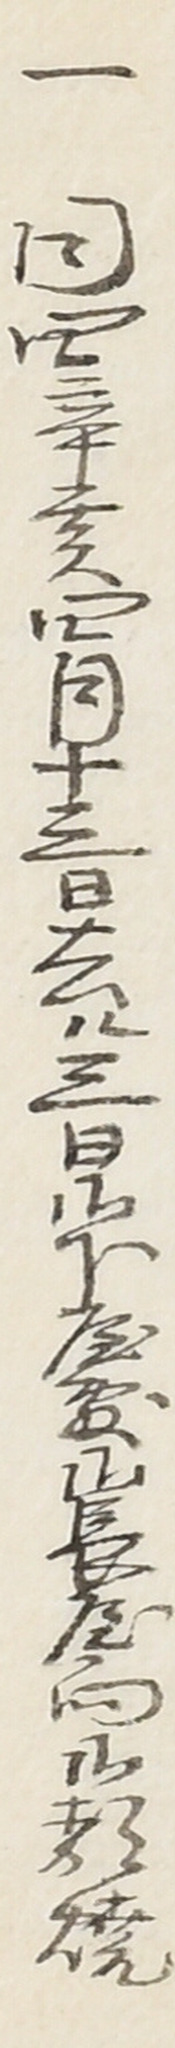一同四年亥四月十三日去ル三日御下屋敷御長屋向御類焼
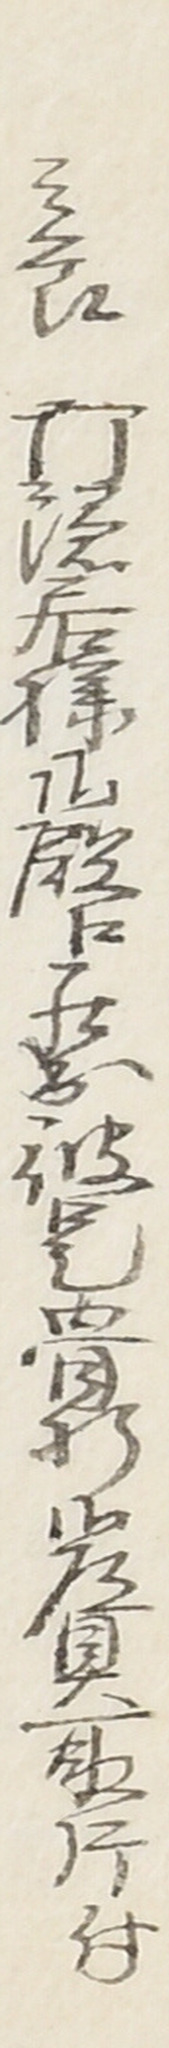之節御隠居様御殿江罷出彼是骨折御道具取片付
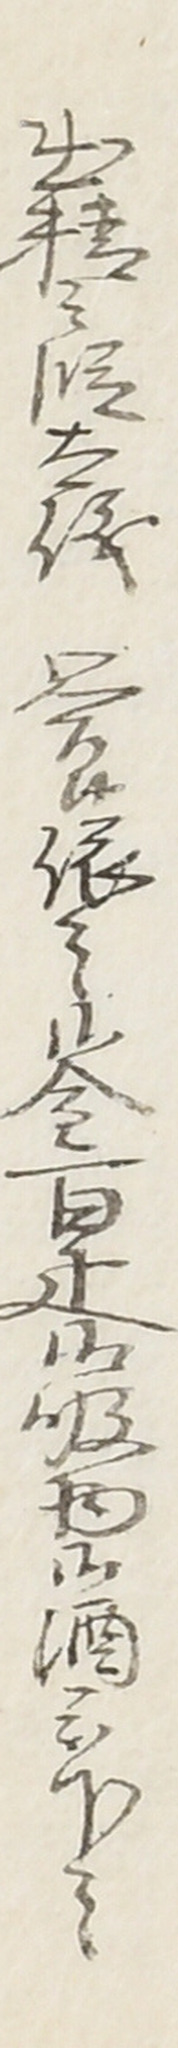出精之段太儀思召候依之御金百疋御吸物御酒被下之
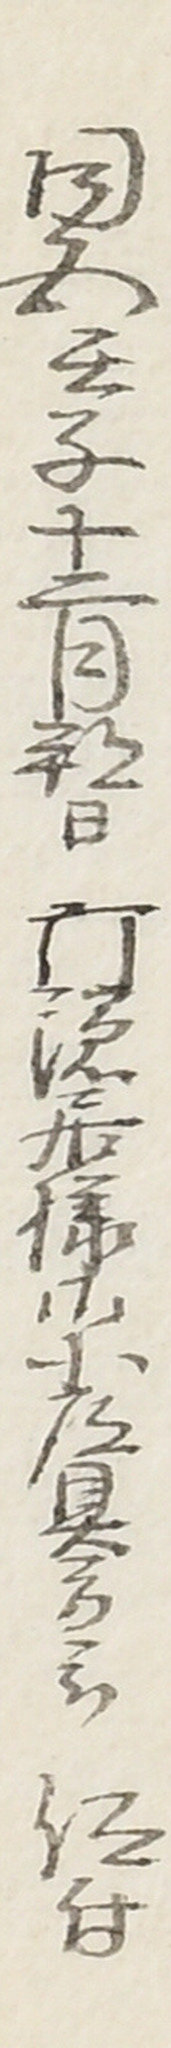一同五壬子十二月朔日御隠居様御小道具方被仰付
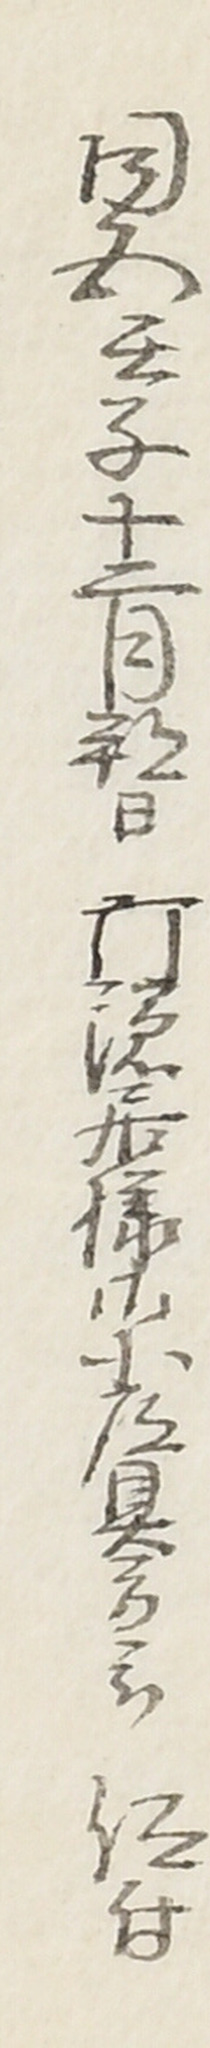一同五壬子十二月朔日御隠居様御小道具方被仰付
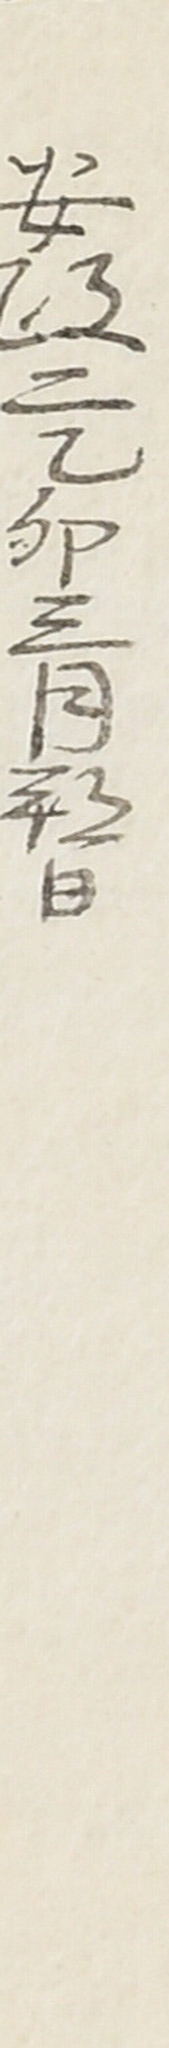一安政二乙卯三月朔日
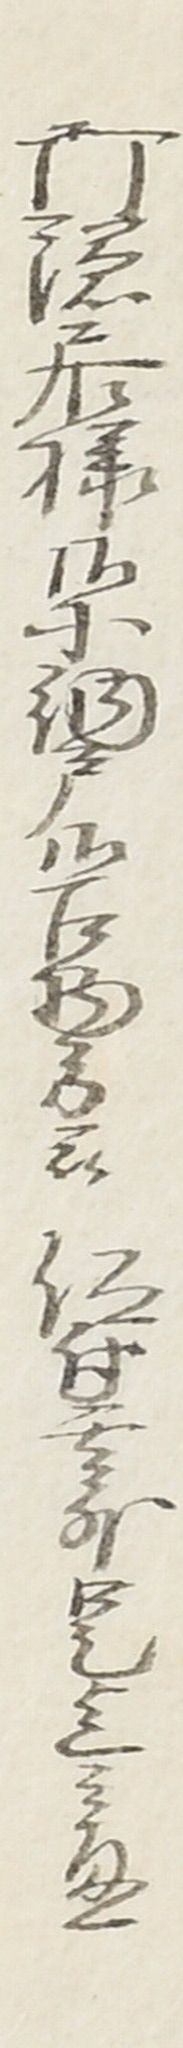御隠居様御小納戸御召物方被仰付其外是迄之通
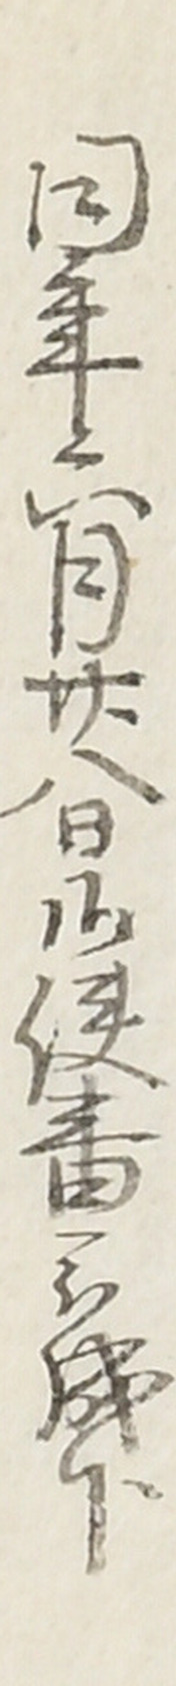一同年六月廿八日御使番被成下
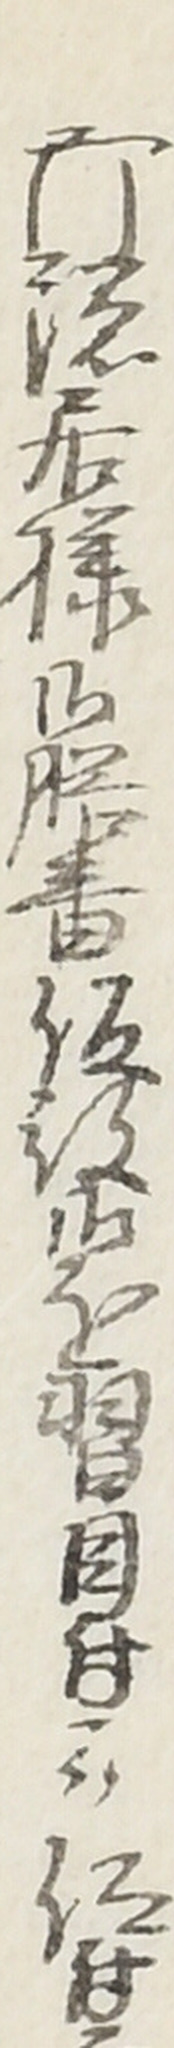御隠居様御膳番仮役御近習目付被仰付其外是迄通
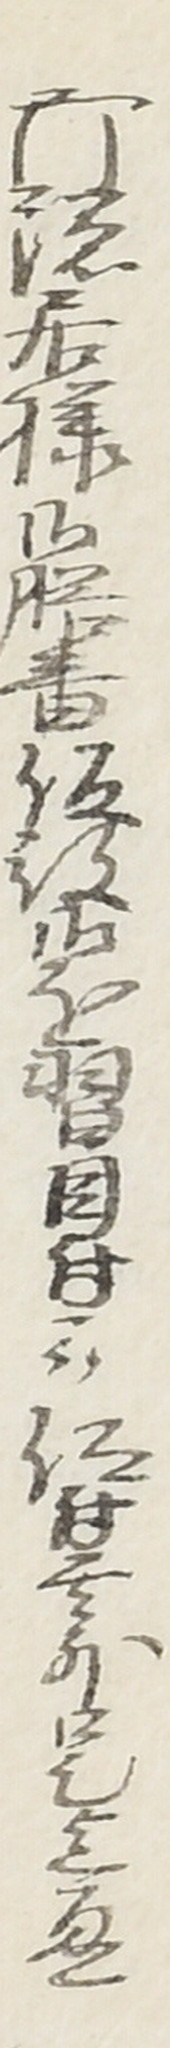御隠居様御膳番仮役御近習目付被仰付其外是迄通
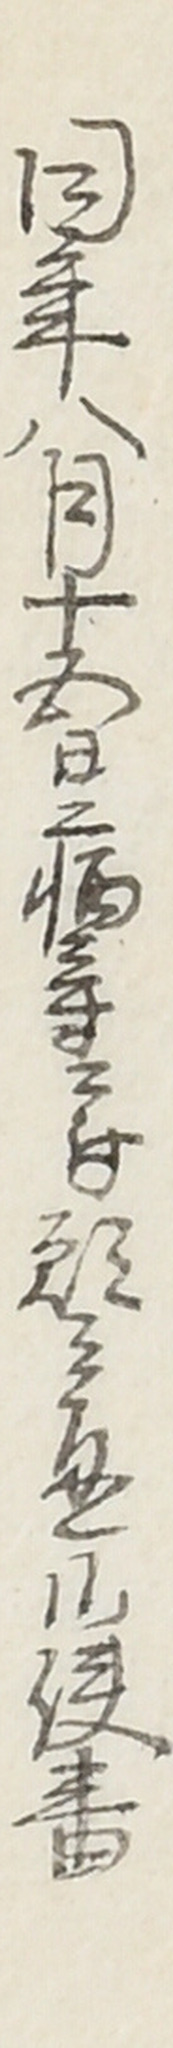一同年八月十五日病気ニ付願之通御使番
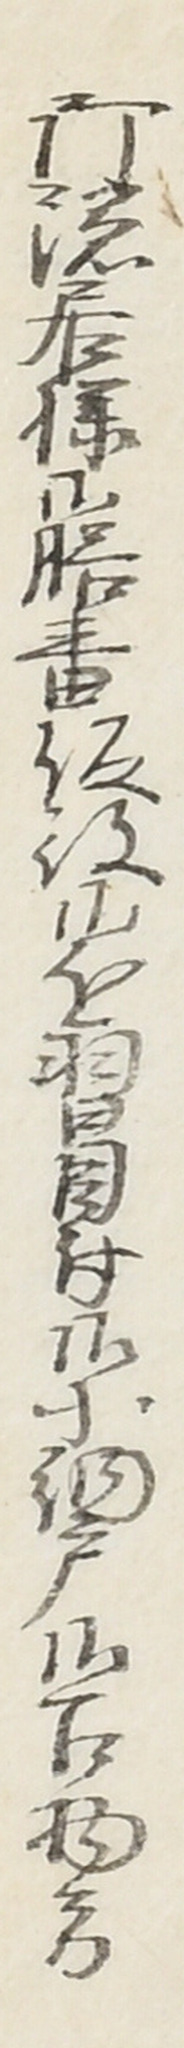御隠居様御膳番仮役御近習目付御小納戸御召物方
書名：給人諸士勤仕録（七）
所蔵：伊那市立高遠町図書館・合同会社AMANE
